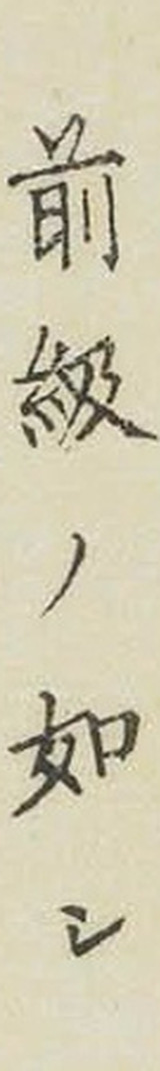前級ノ如シ
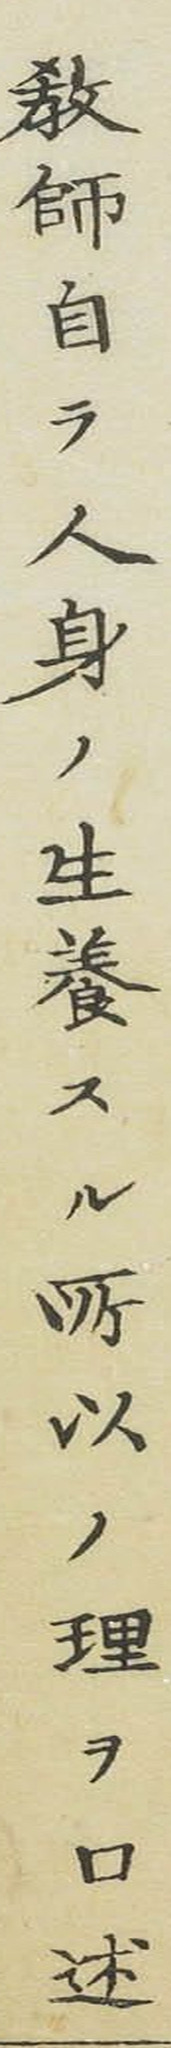教師自ラ人身ノ生養スル所以ノ理ヲ口述
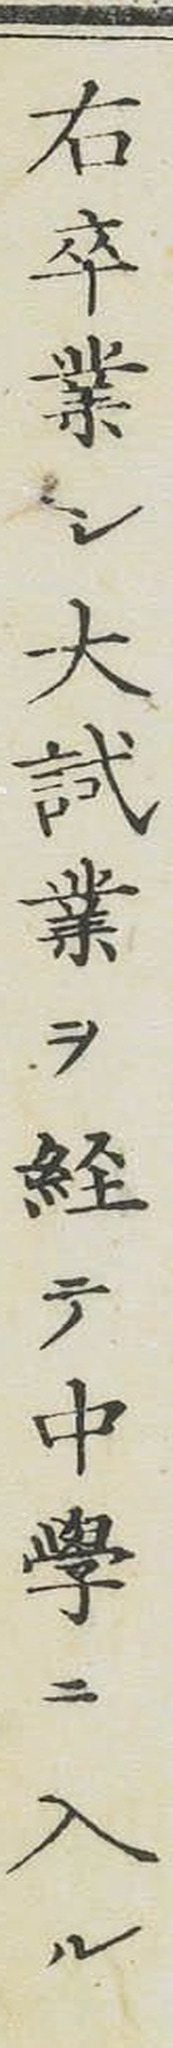右卒業シ大試業ヲ経テ中学ニ入ル

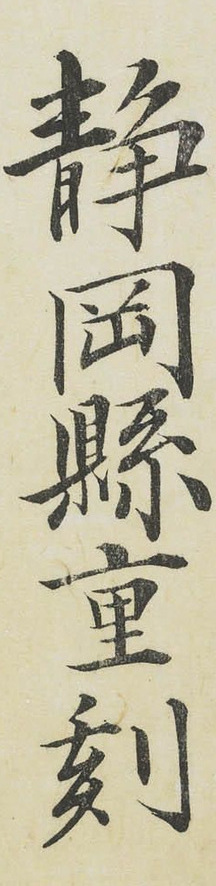静岡県重刻
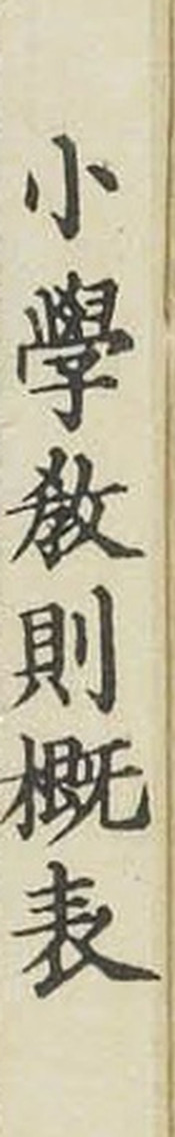小学教則概表
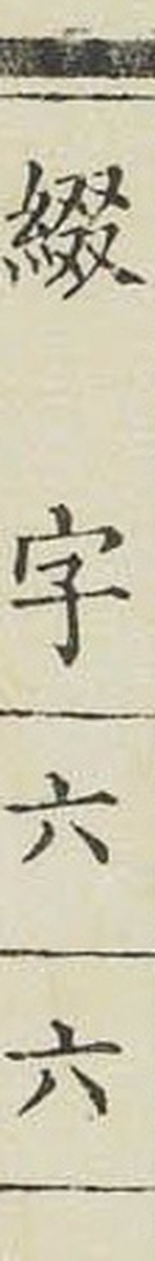綴字六六
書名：小学教則
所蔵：東京学芸大学教育コンテンツアーカイブ
